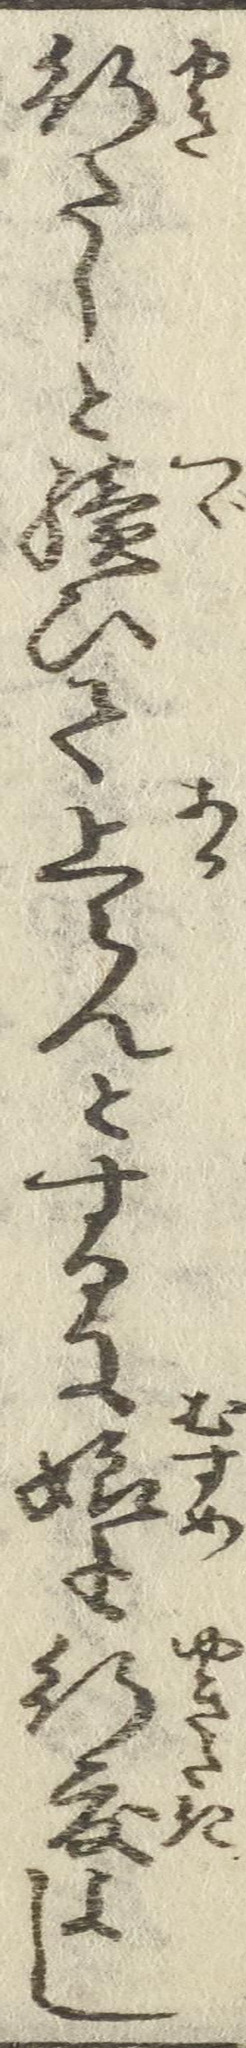行たしと続ひて上らんとするに娘も行度よし
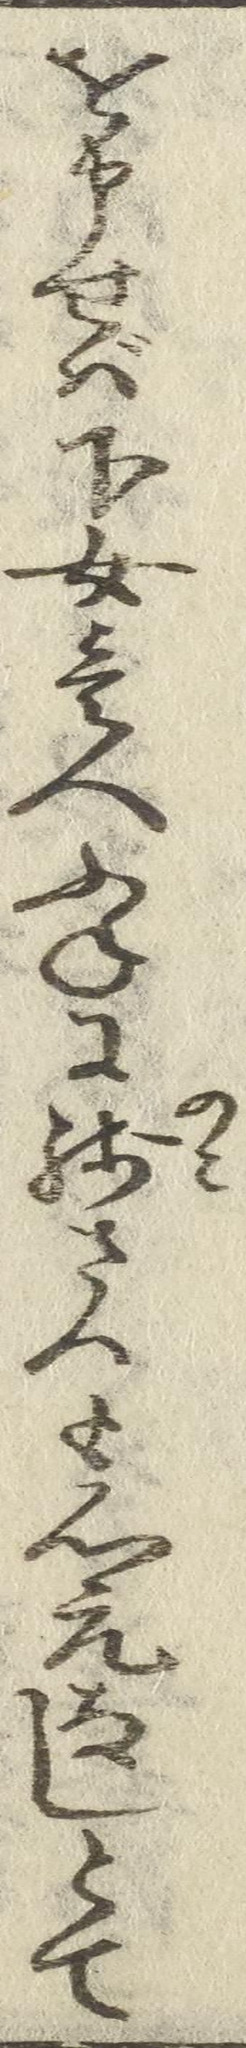を申せば下女壱人ふねに残さんも心元なしとて
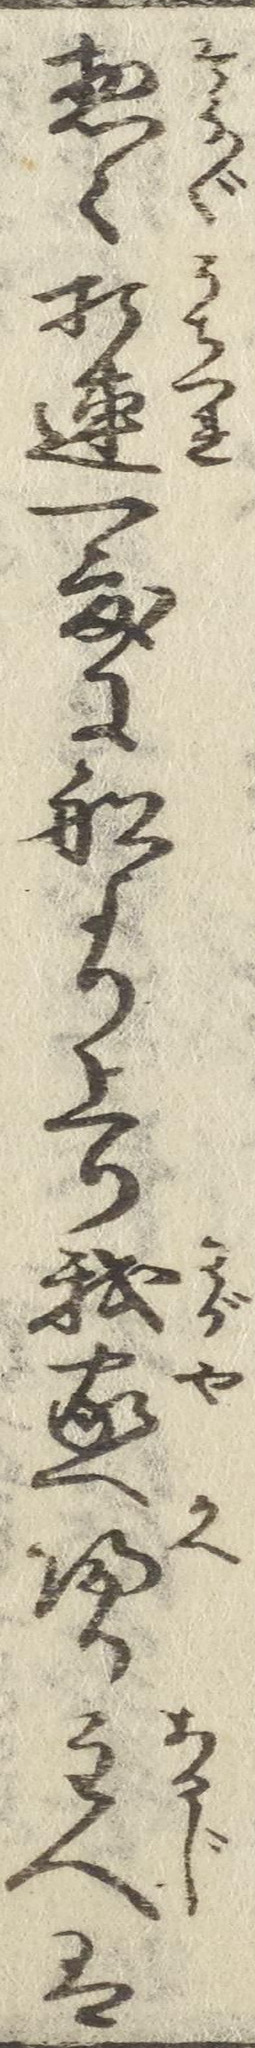惣々打連一度に船より上り我家へ帰り主人は
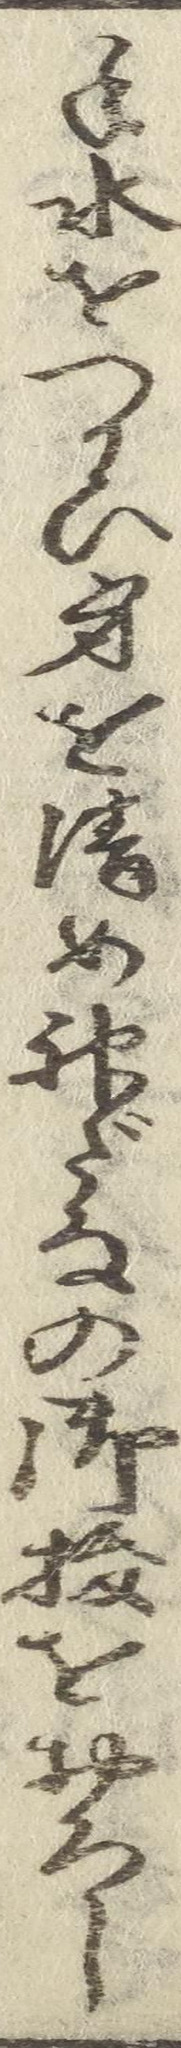手水をつかひ身を清め神だなの御祓をおろし
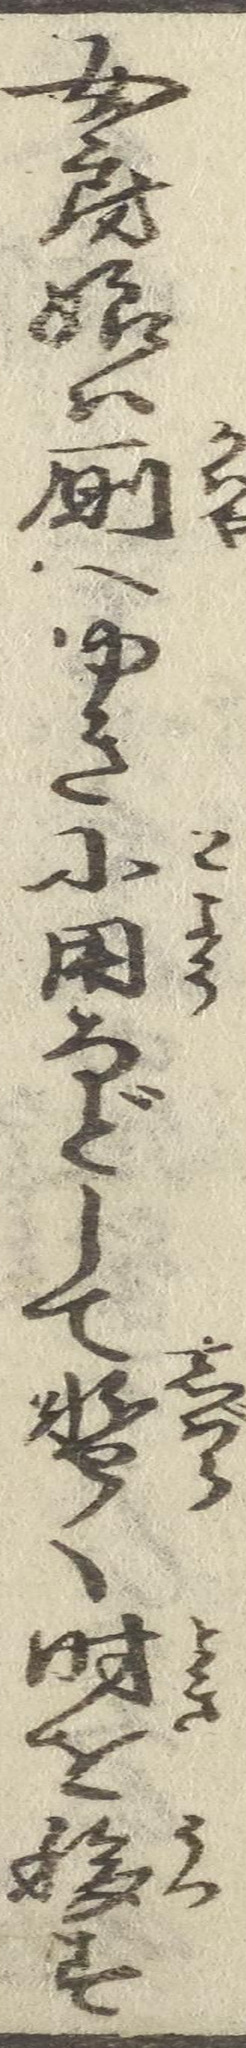女房娘は厠へゆき小用などして暫く時を移す

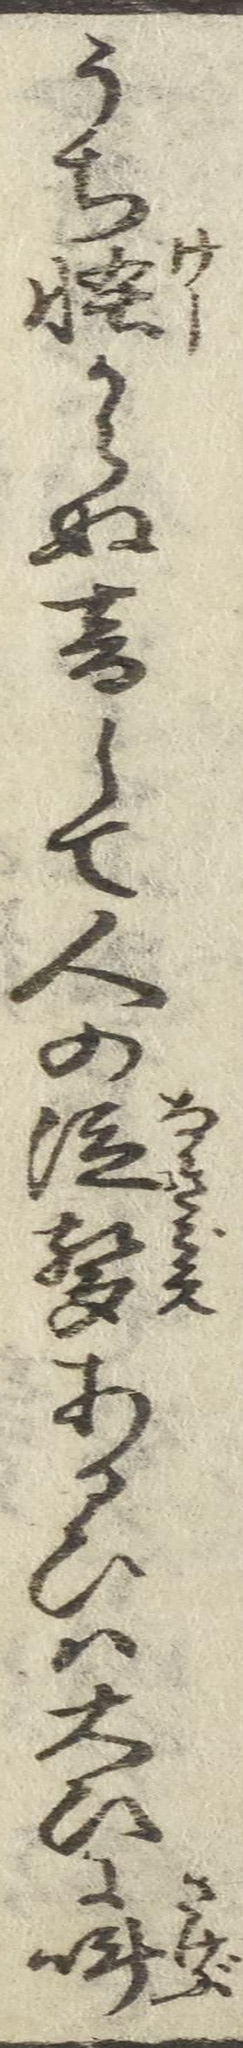うち怪からぬ音して人の泣声あるひは大ひに叫
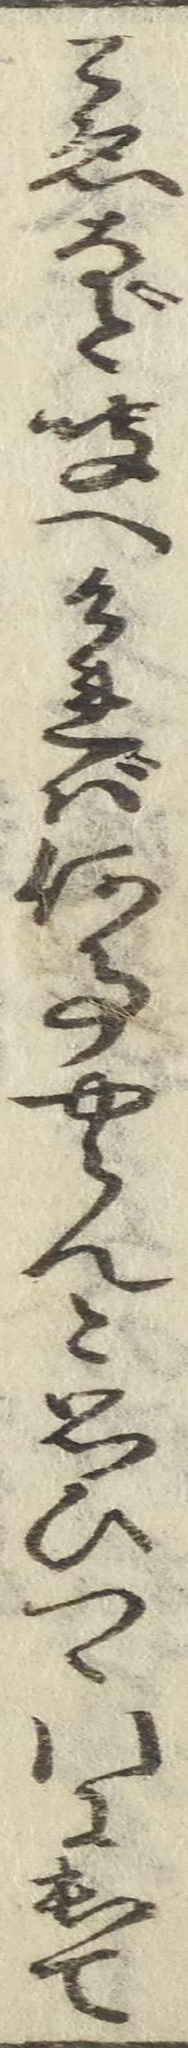こゑなど聞へければ何事やらんと思ひつゝ門に出て
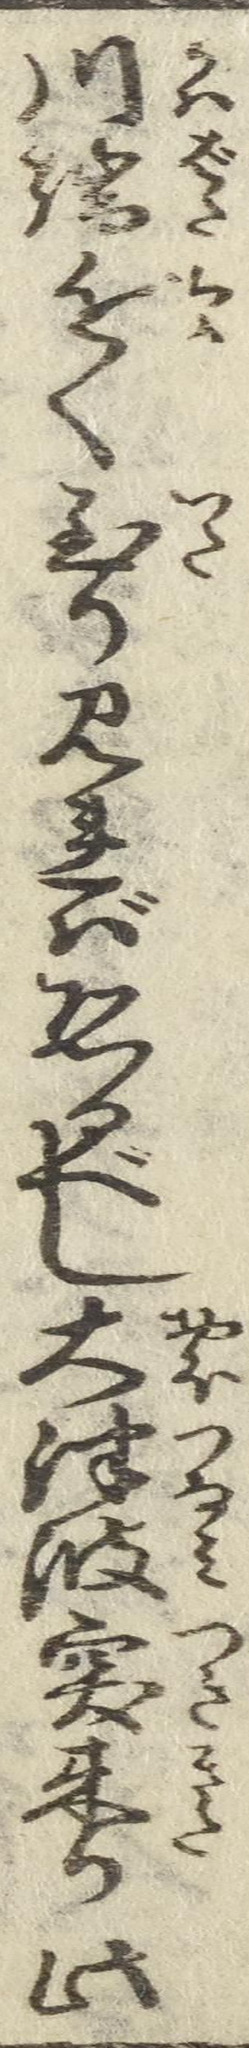川端近く至り見れば恐るべし大津波突来り此
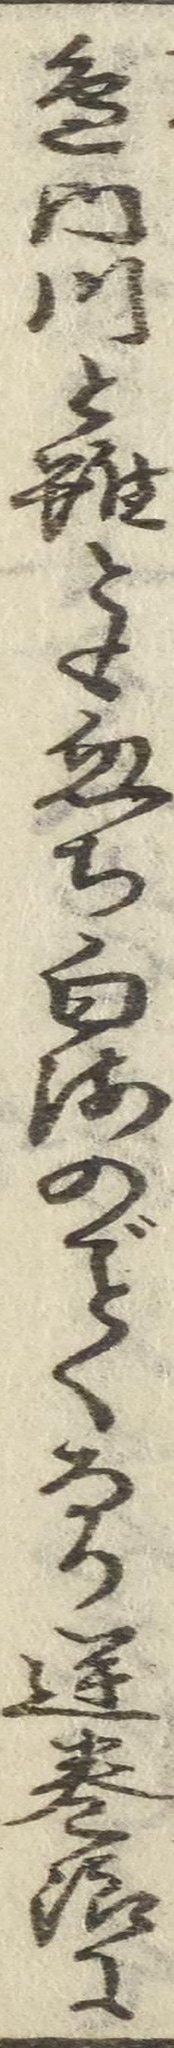辺内川と雖とも忽ち白海のごとくなり逆巻浪に
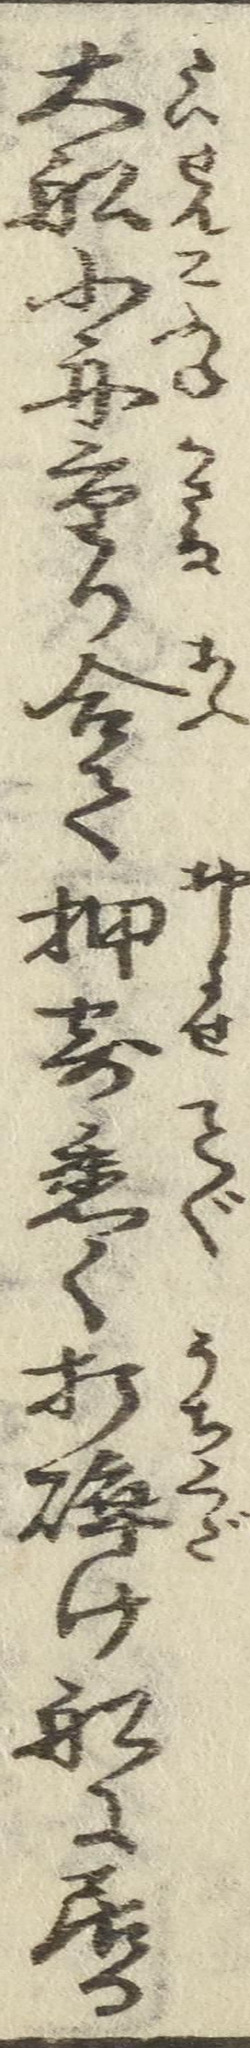大舩小舟重り合て押寄悉く打砕け舩に居る
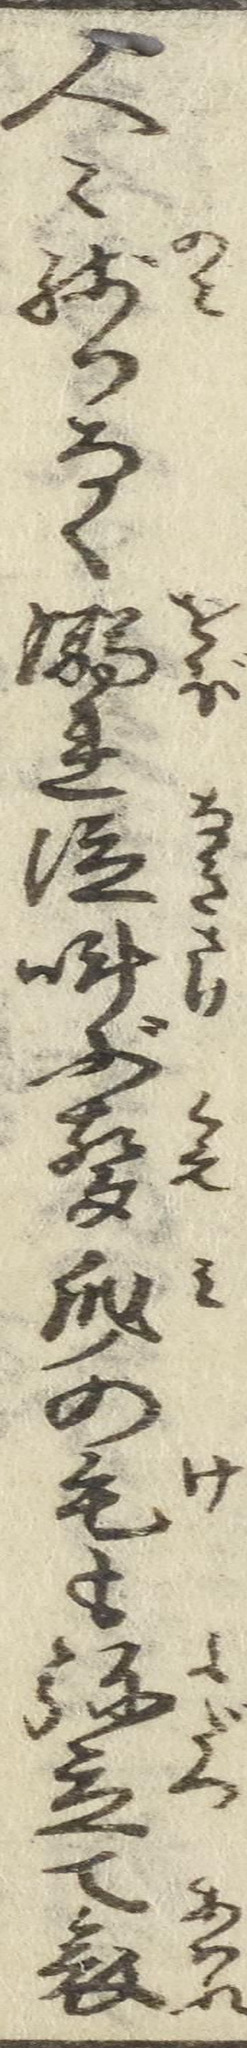人々残りなく溺れ泣叫ぶ声身の毛も弥立て哀
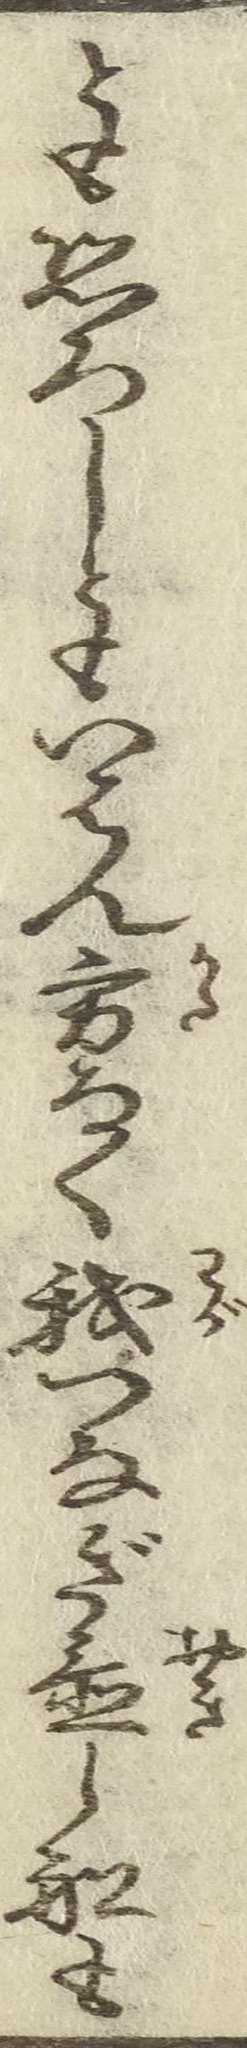とも恐ろしくともいはん方なく我つなぎ置し舩も
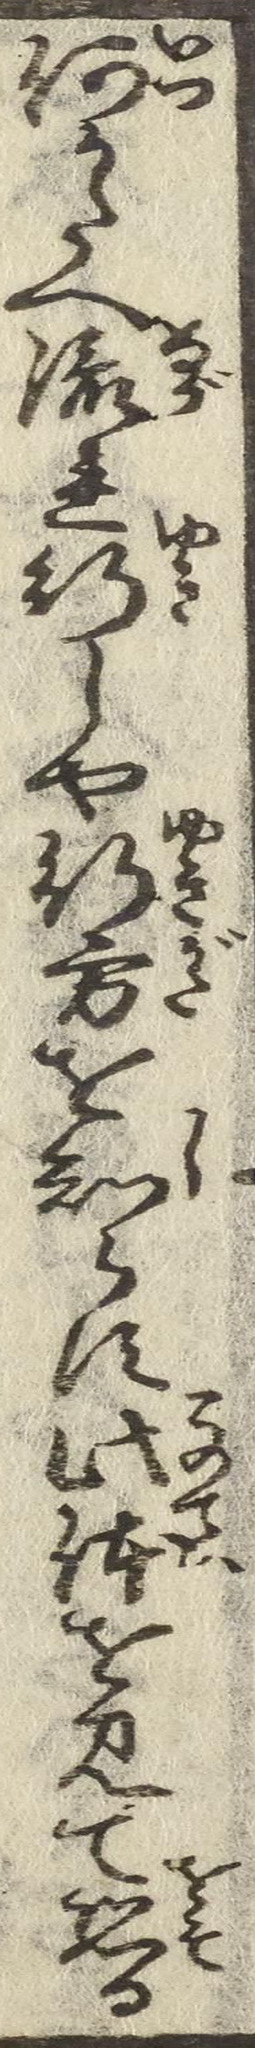何かたへ流れ行しや行方を知らす此体を見て恐る
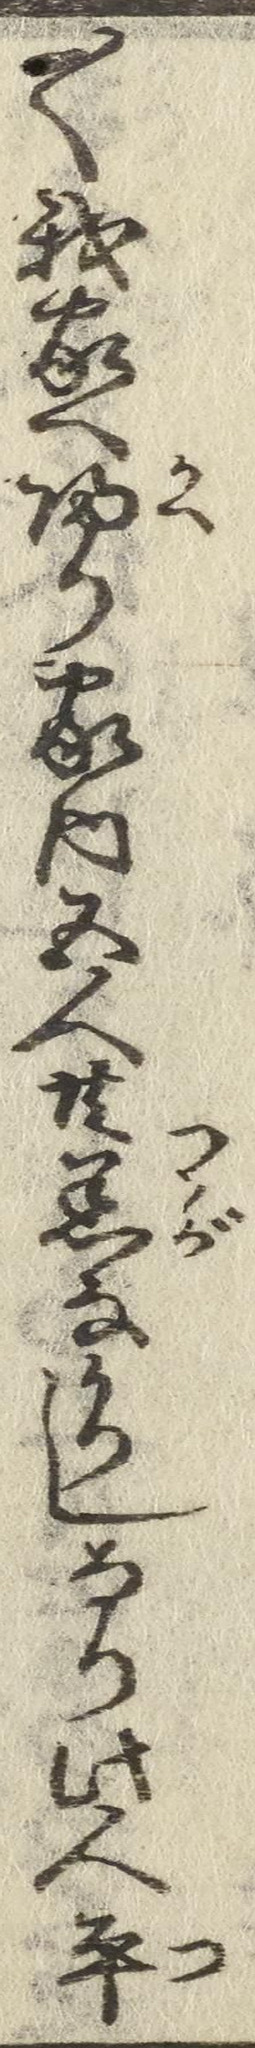〳〵我家へ帰り家内五人共恙なかりしなり此人平
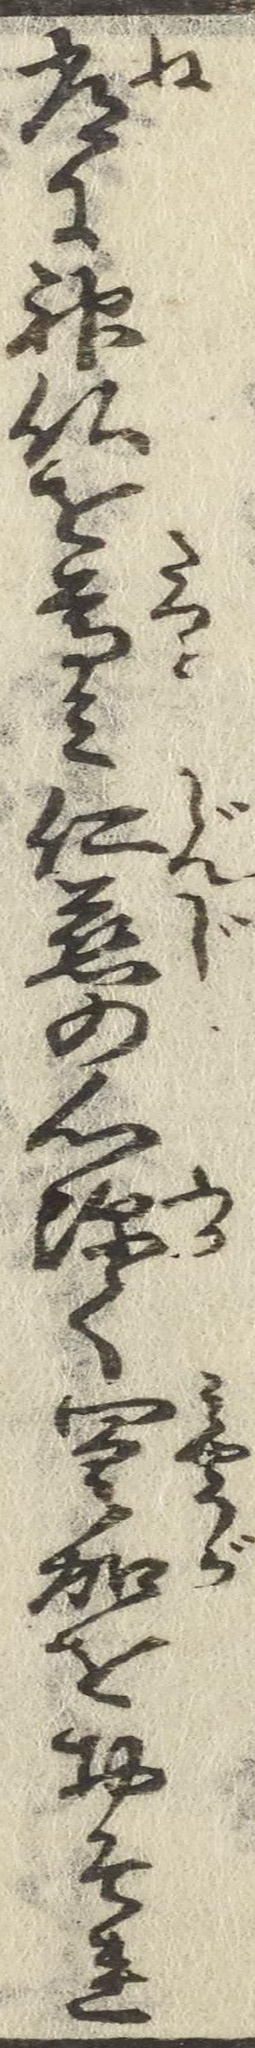常に神仏を尊み仁慈の心深く冥加をおそれ
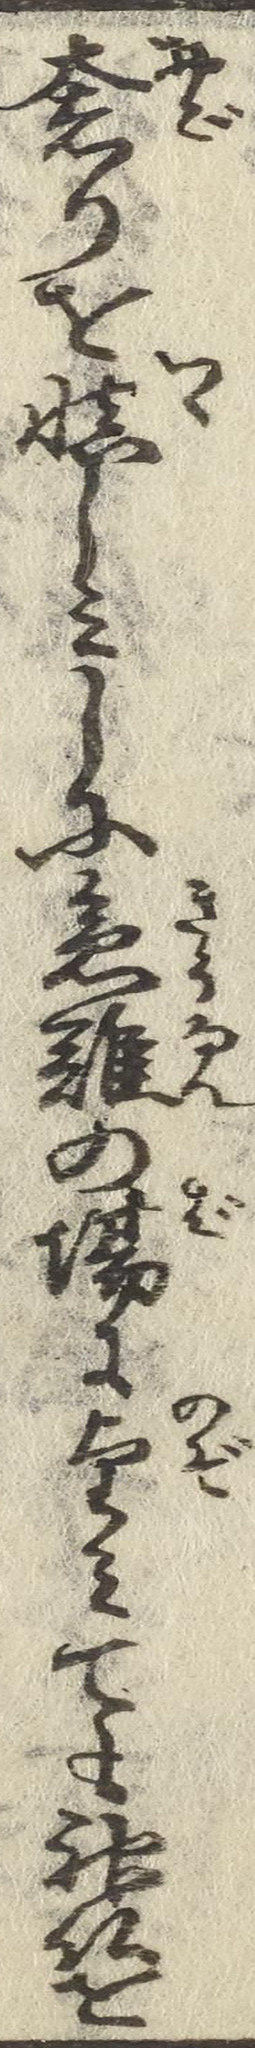奢りを慎しみしに急難の場に望みても神仏を
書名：大地震　津涛乃奇談　第二集
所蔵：東京大学地震研究所図書室 Earthquake Research Institute Library, The University of Tokyo, JAPAN
